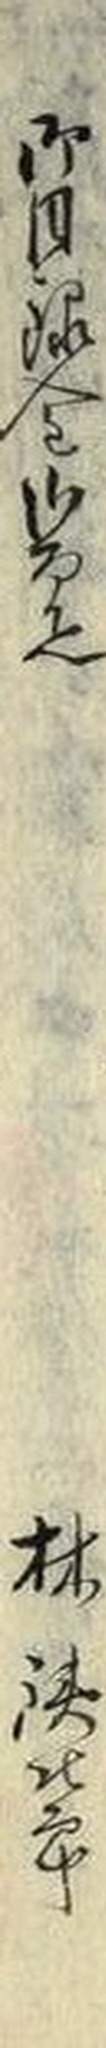御目録金弐百疋林鉄次郎
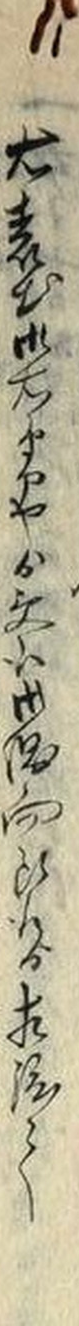右表出御右筆部やゟ受取御側向頭取ゟ相渡之
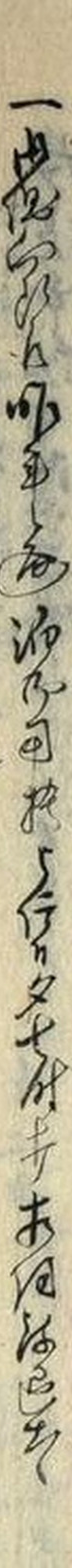一御側向頭取昨年之通泊御用捨被仰付夕七時打相伺致退出候
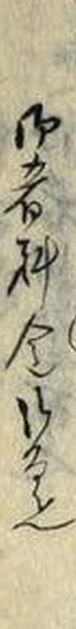御肴料金弐百疋
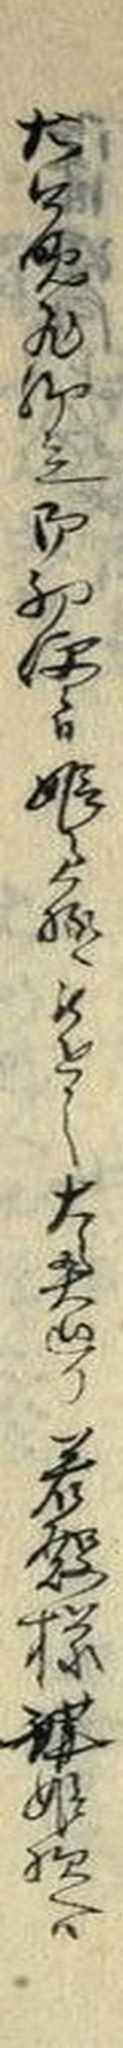右今晩飛脚立御初便ニ付姫君様へ被進之大奥廻り若殿様謹姫様へハ

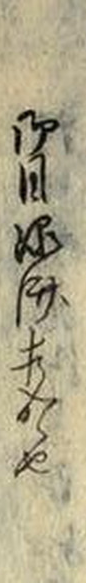御目録済相成候由
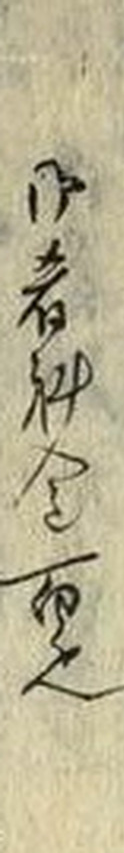御肴料金百疋
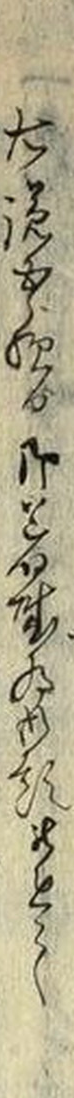右謙五郎様ゟ御着城為御歓被進之
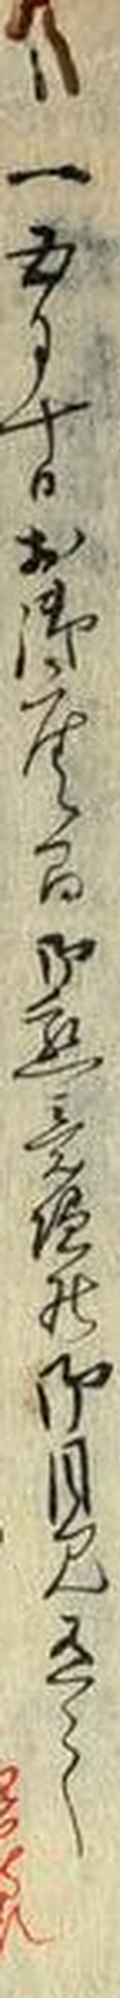一五月十日於御座之間御懇意隠居御目見有之
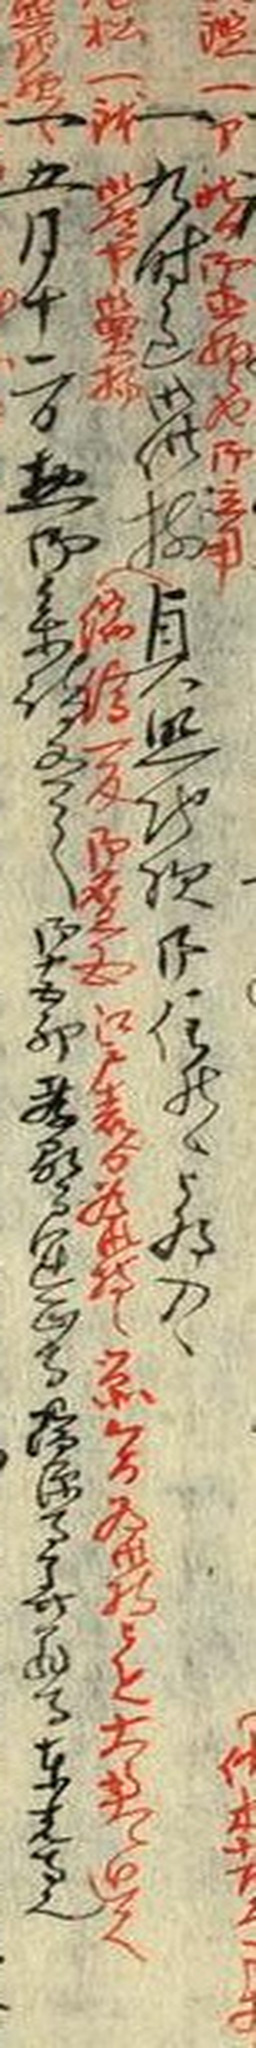一五月十二日惣御参詣有之御宮初孝顕寺運正寺瑞源寺華蔵寺東光寺也
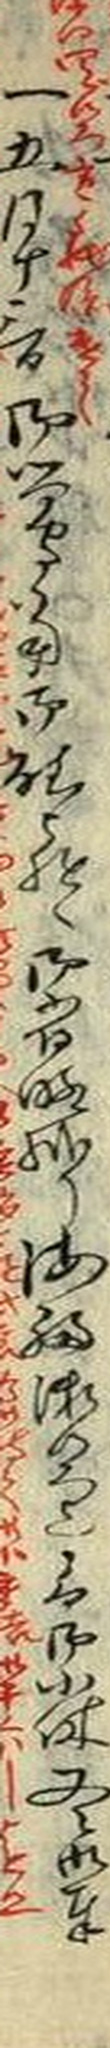一五月十三日御留守御用御聴被遊候御省略掛り海福瀬左衛門迄ニ而御小休又々御奉
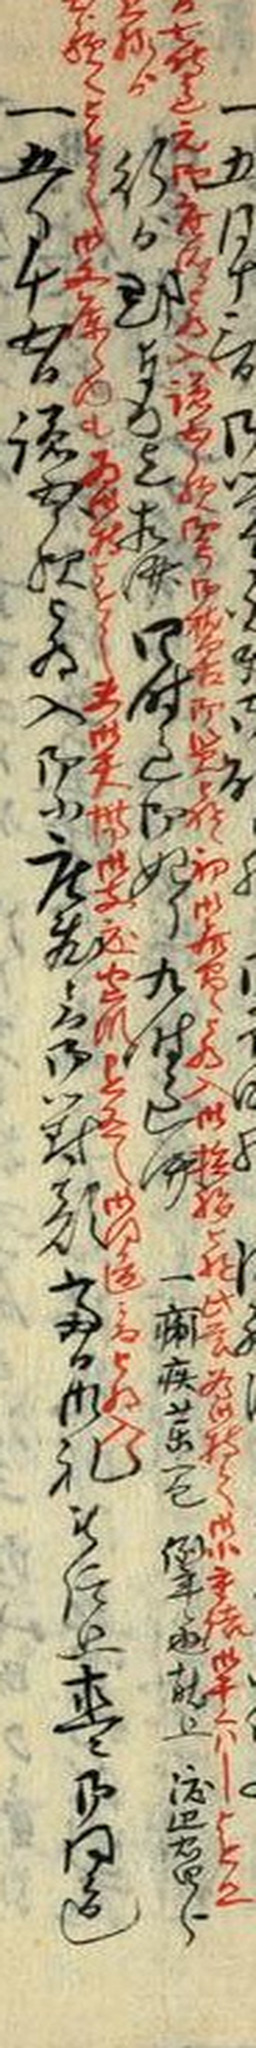一五月十五日謙五郎様被為入御小座敷ニ而御対顔当日御礼被仰上直ニ御同道
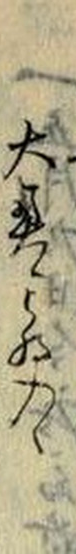大奥へ被為入候
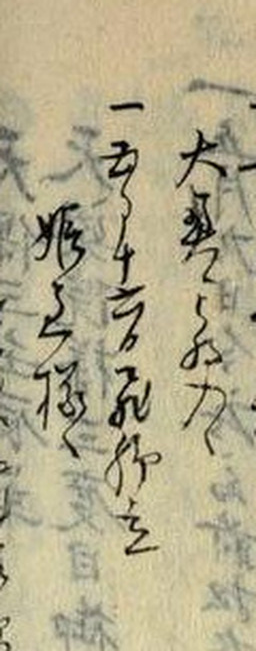一五月十六日飛脚立
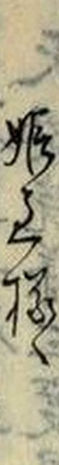姫君様ゟ
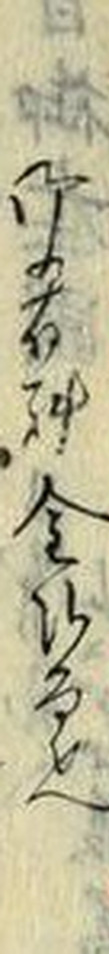御肴料金百疋
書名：少傅日録抄（斉承付側向頭取日記、在国）
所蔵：福井県文書館 Fukui Prefectural Archives
